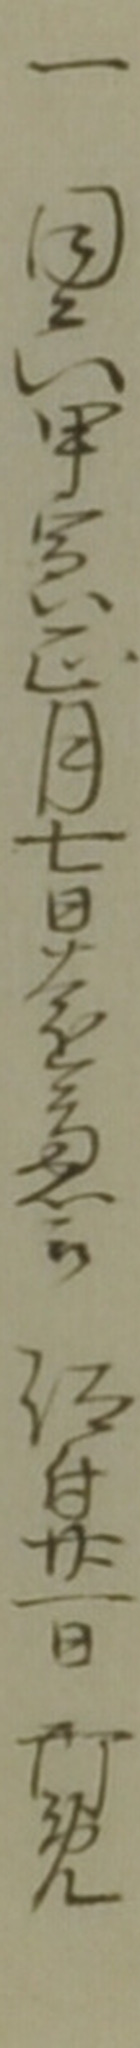一同六甲寅正月七日遠慮被仰付廿一日御免
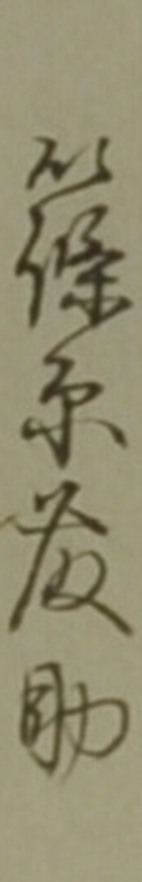篠原藤助

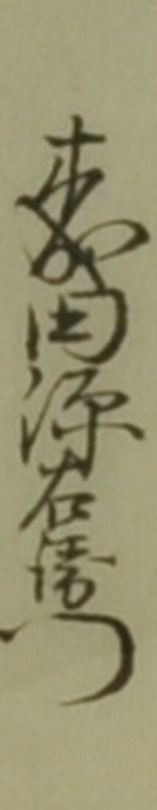森田源右衛門
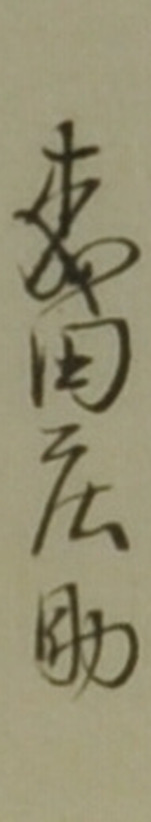森田庄助
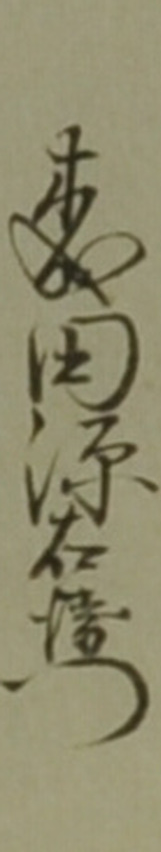森田源右衛門
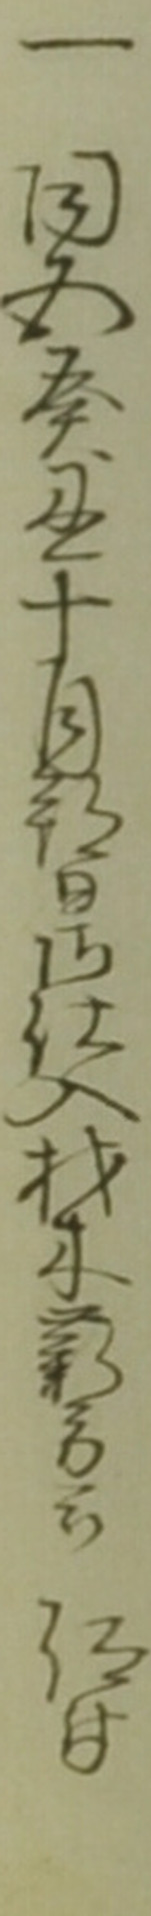一同五癸丑十月朔日御仕入材木薪方被仰付

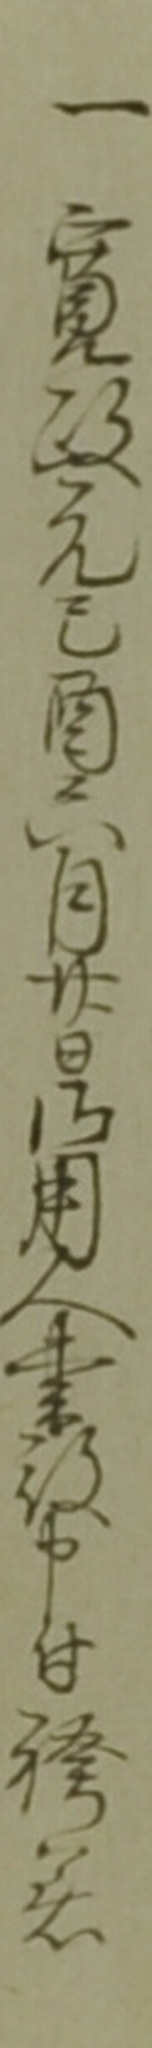一寛政元己酉六月廿日御用人書役申付袴着
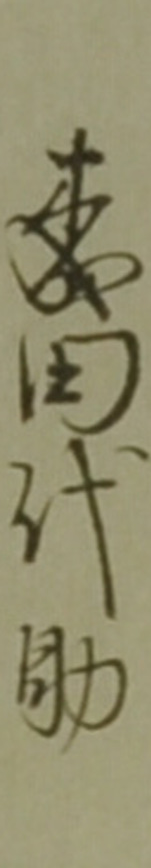森田代助
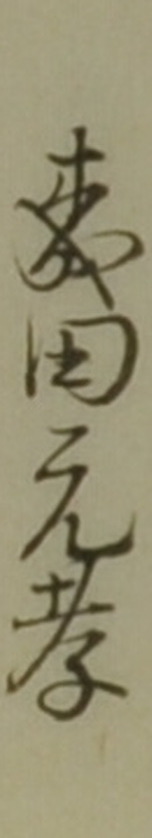森田元孝
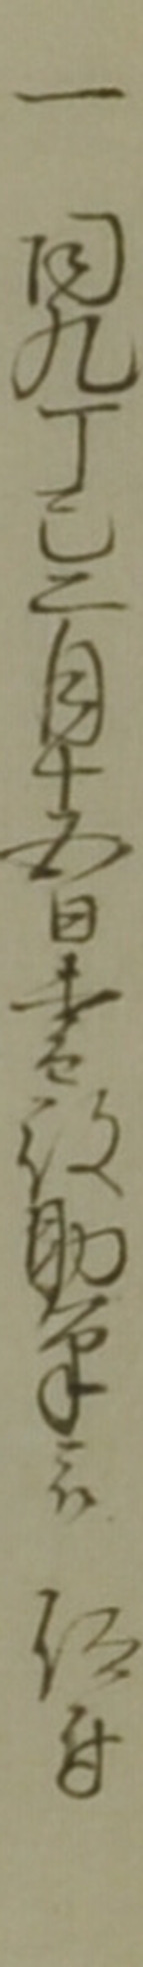一同九丁巳二月十五日書役助筆被仰付
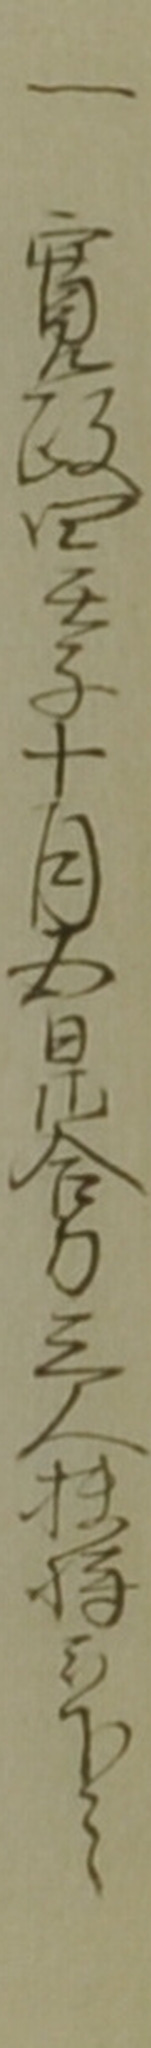一寛政四壬子十月五日御合力三人扶持被下之
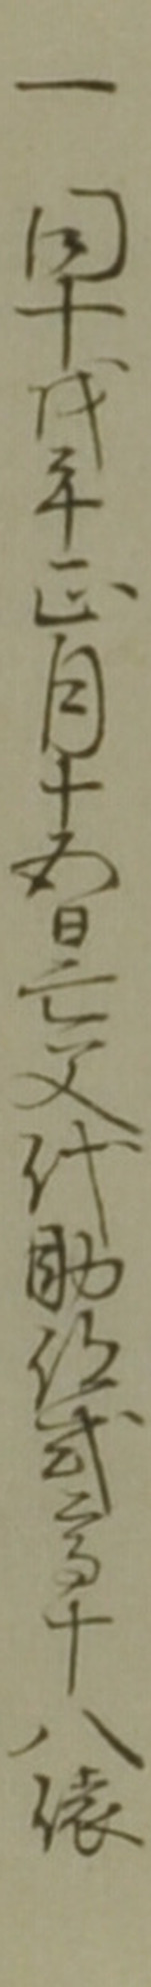一同十戊午正月十五日亡父代助跡式高十八俵
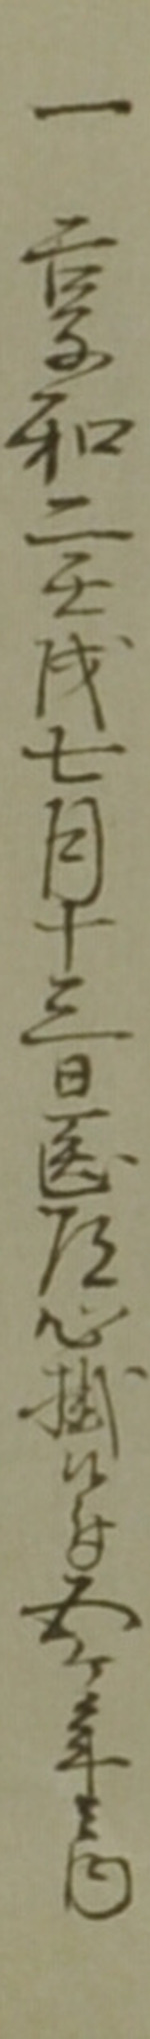一享和二壬戌七月十三日医道心掛候付五ヶ年之内
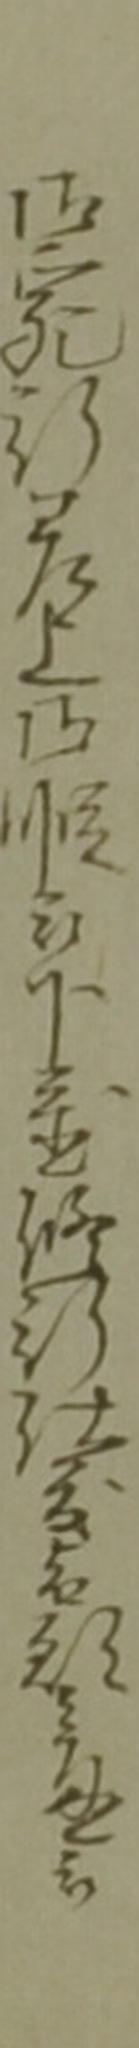御宛行差上御暇被下置修行仕度旨願之通被
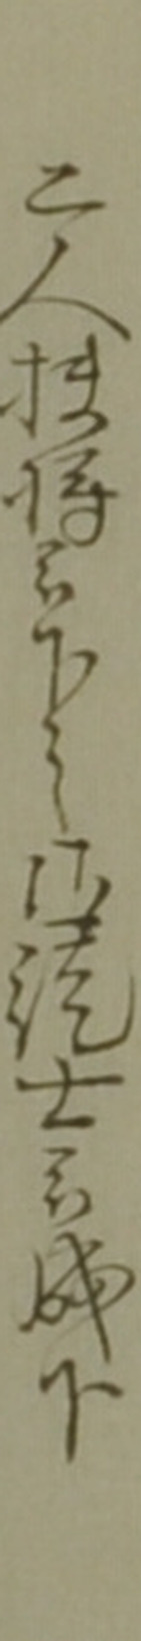二人扶持被下之御徒士被成下
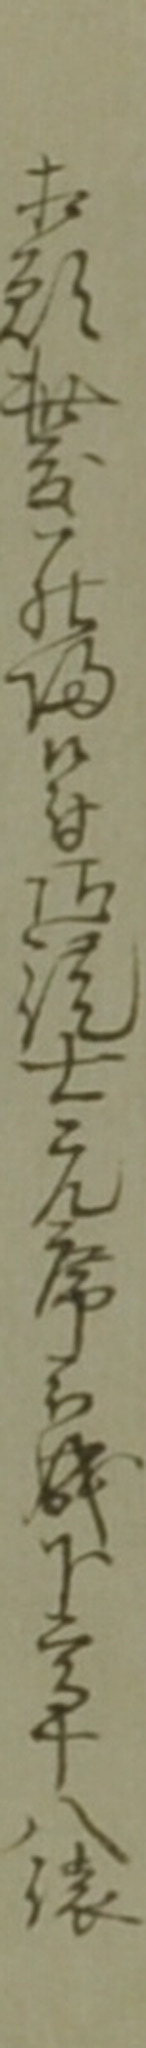相願此度罷帰候付御徒士元席被成下高十八俵
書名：無足廃家（弐）
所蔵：伊那市立高遠町図書館・合同会社AMANE
